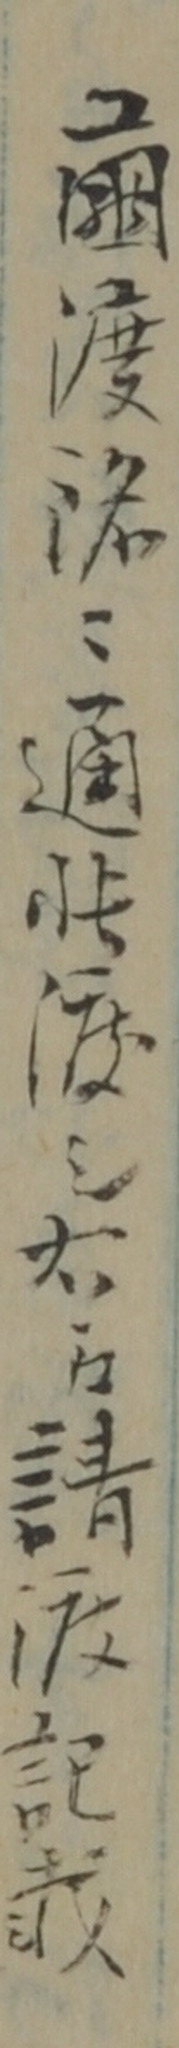繭渡銘々通帳渡シ右江請渡記載
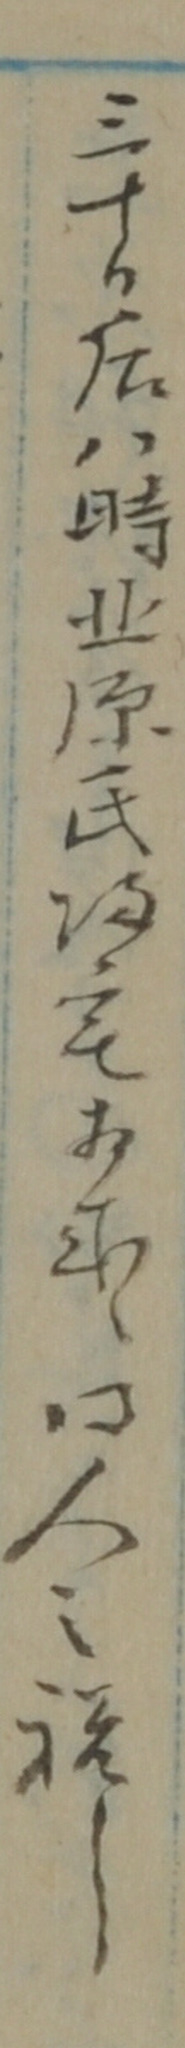三十日后八時北原氏帰宅相成し同人之祝し
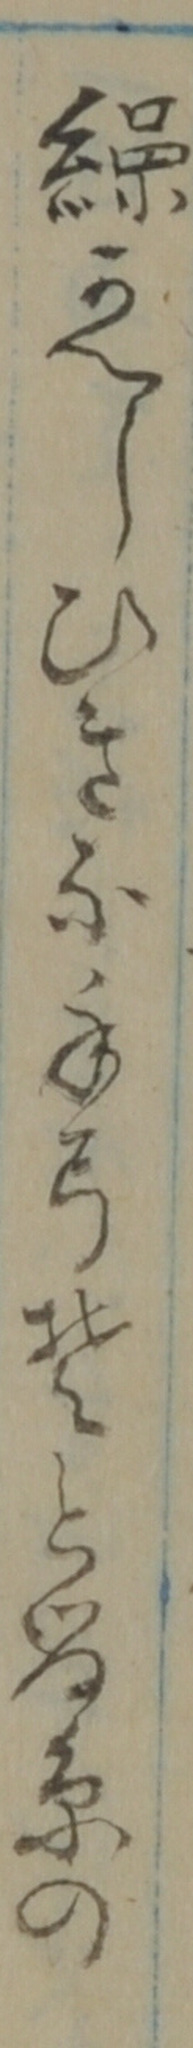繰かへしひきなて弓そとる糸の
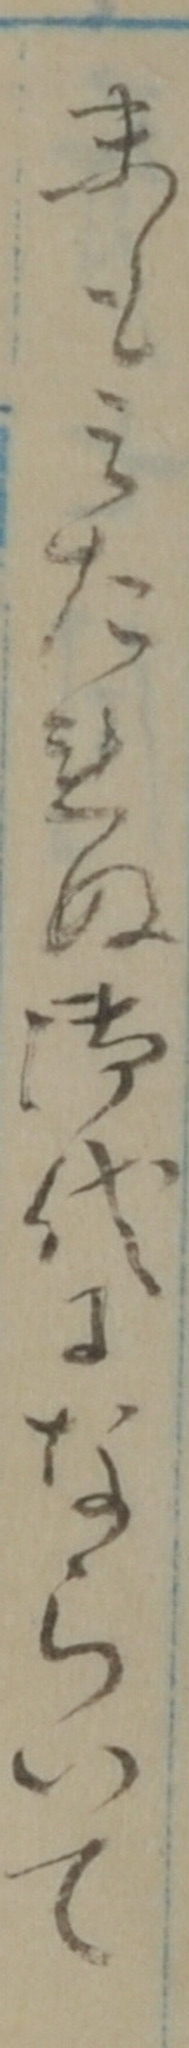末もミたれぬ御代にならいて

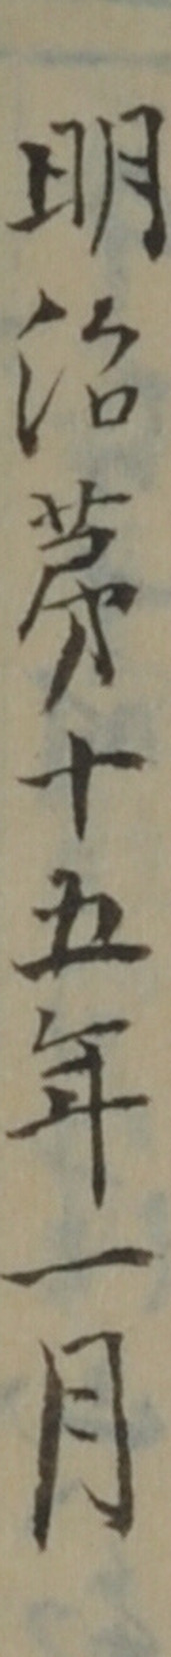明治第十五年一月
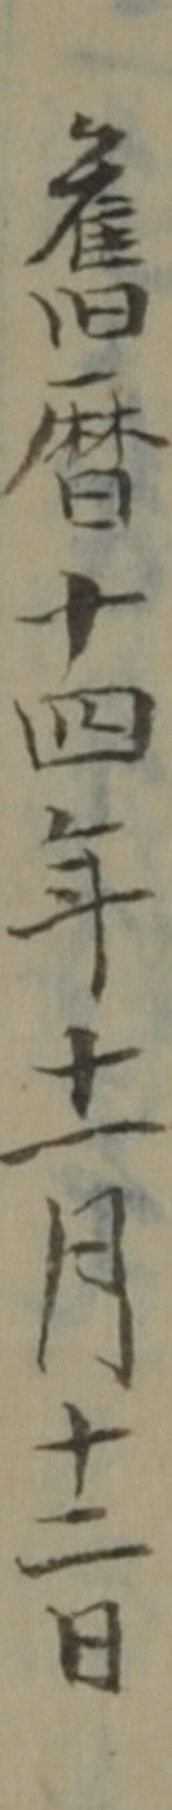旧暦十四年十一月十二日
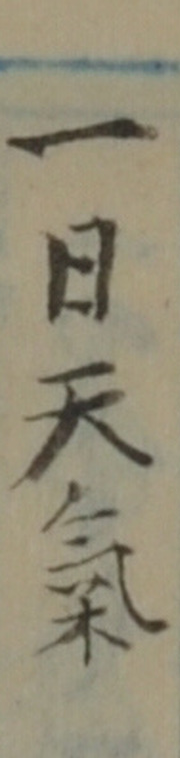一日天気
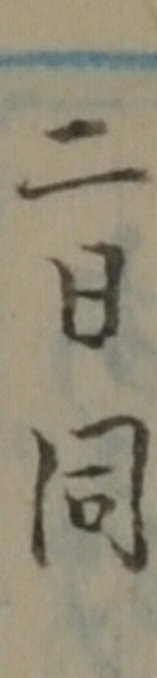二日同
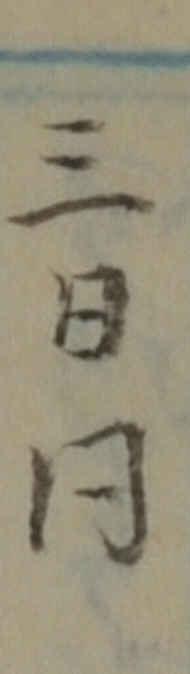三日同
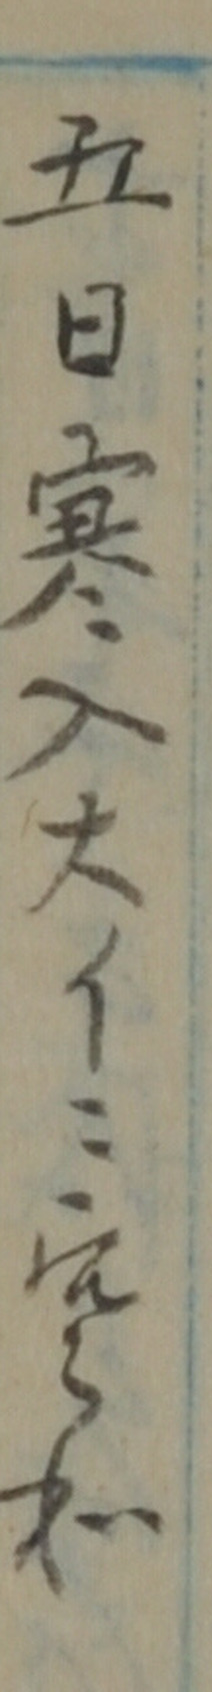五日寒入大イニ寒和
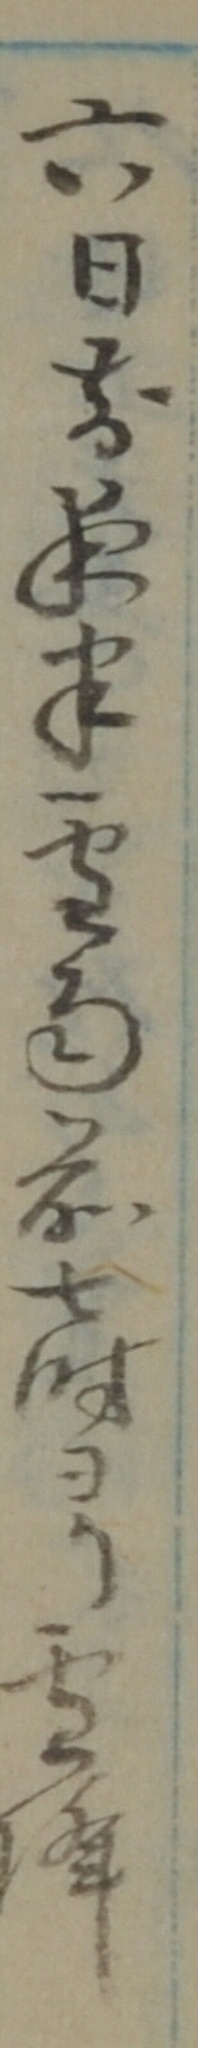六日前夜半雪雨前七時ヨリ雪降
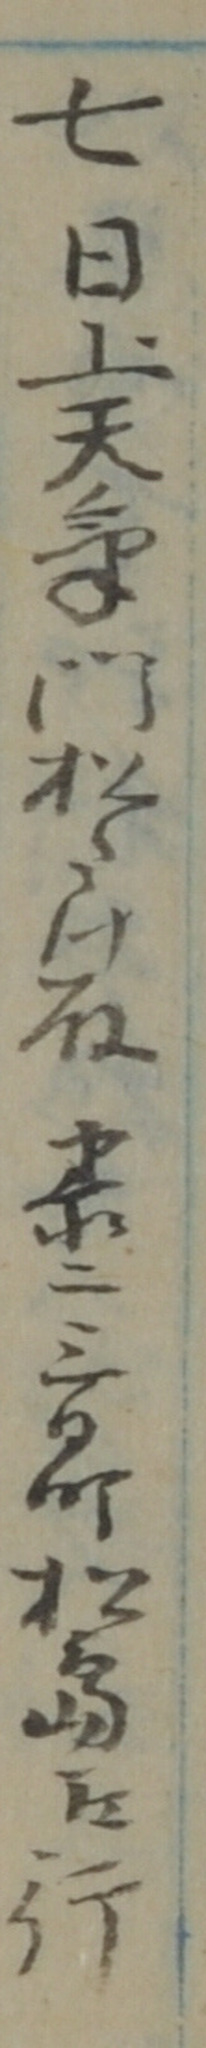七日上天気門松たけ取養二三日町松島江行

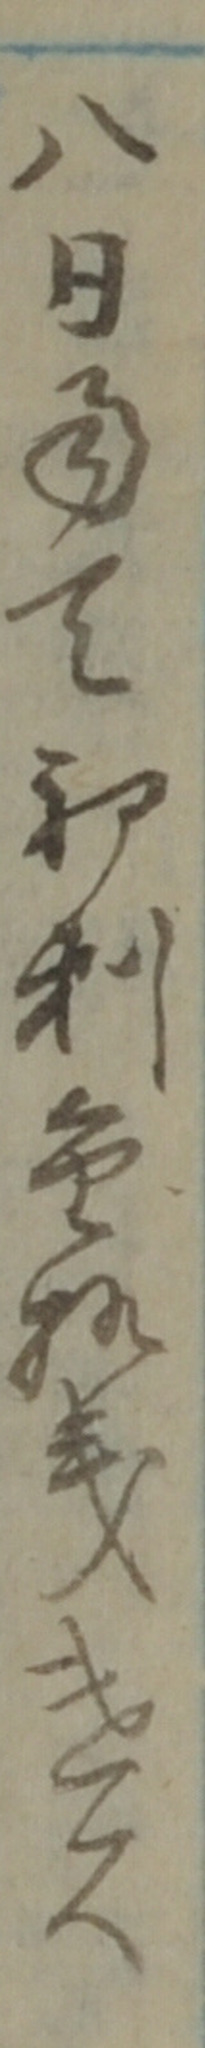八日雨天初利重拾銭遣ス
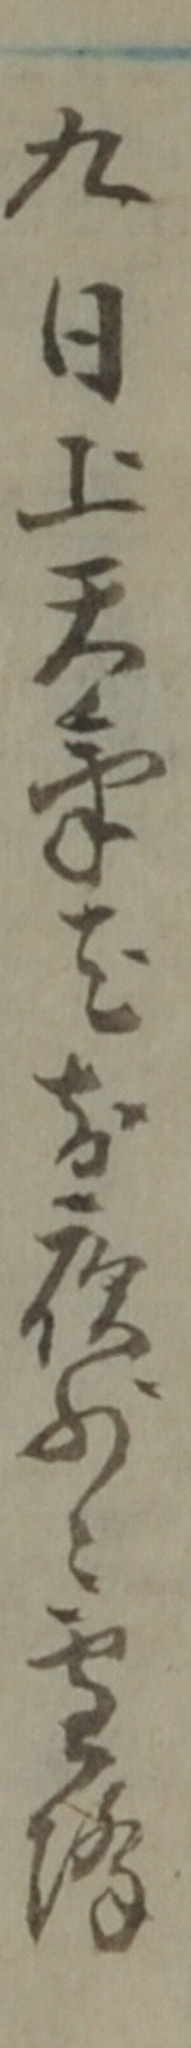九日上天気尤前夜少々雪降
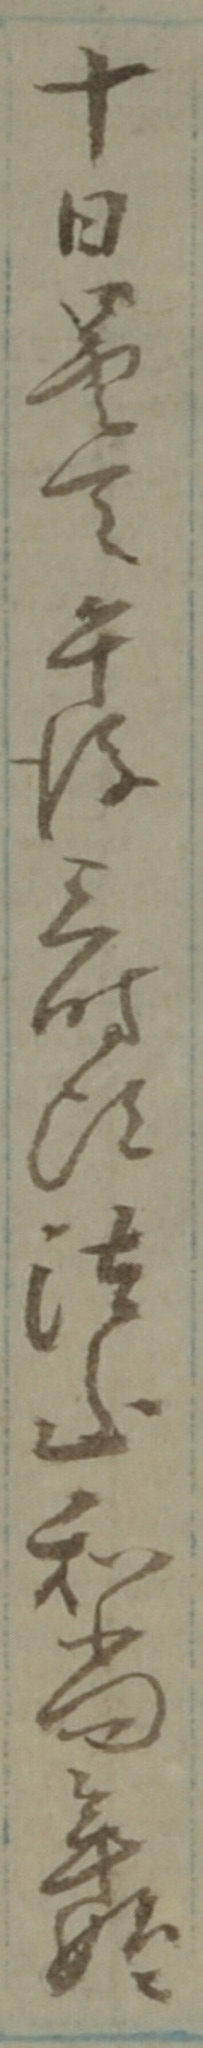十日曇天午後三時頃法山和尚年始ニ
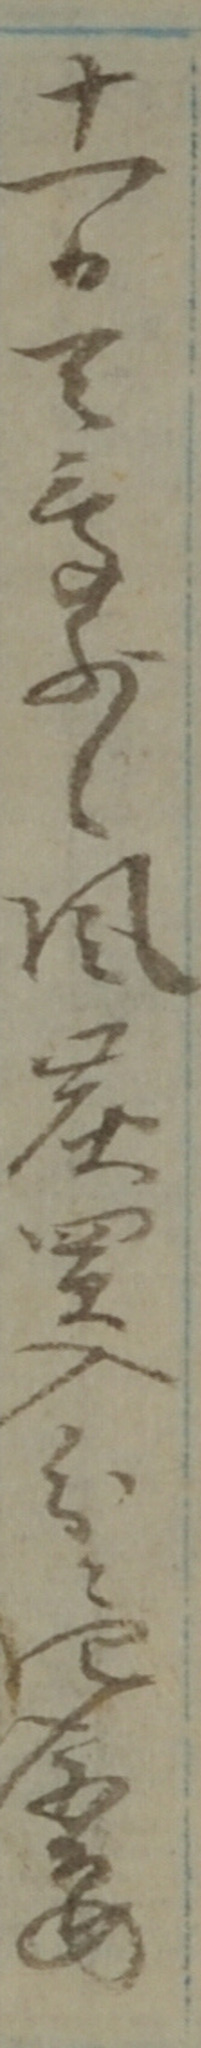十一日天気少々風炭買入分ニ四〆五百め
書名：機械製糸所日記
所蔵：伊那市立高遠町図書館・合同会社AMANE
